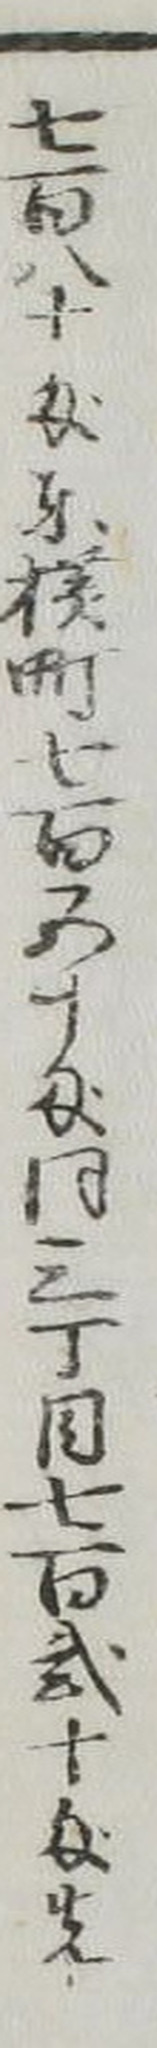七百八十匁東横町七百五十匁同三丁目七百弐十匁先
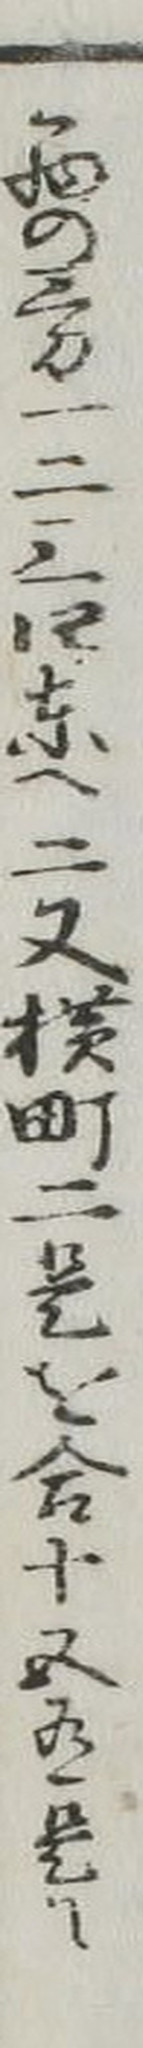西の方一二三四東へ二又横町二是を合十五有是に
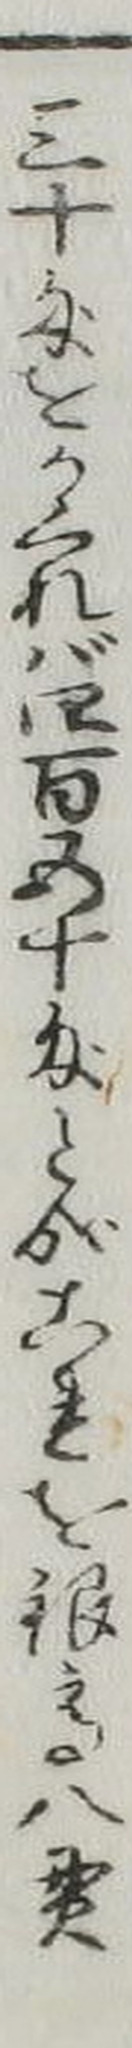三十匁をかくれば四百五十匁と成これを銀高八貫
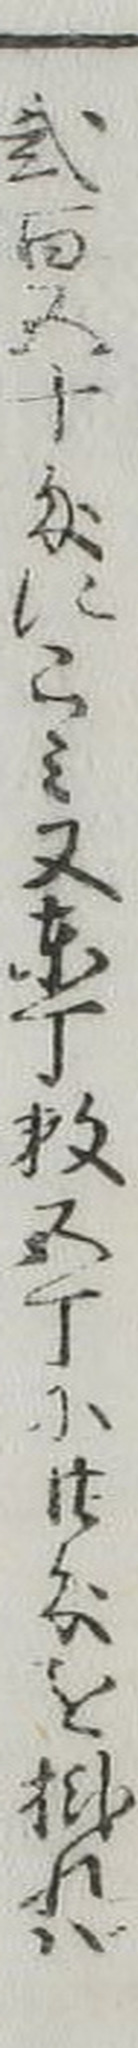弐百五十匁にこみ又東丁数五丁に廿匁を掛れば
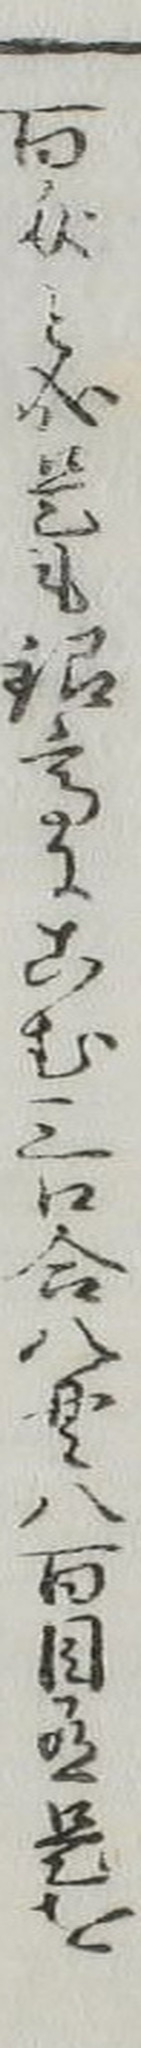百匁と成是も銀高にこむ三口合八貫八百目有是を
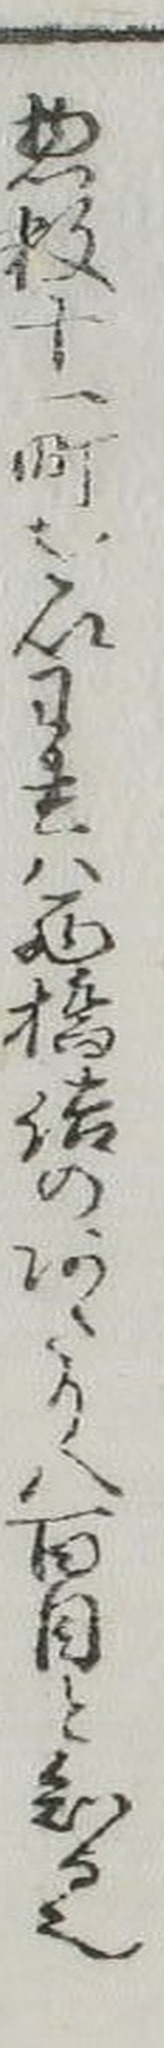惣数十一町を以われは西橋詰のあたり八百目と知る也
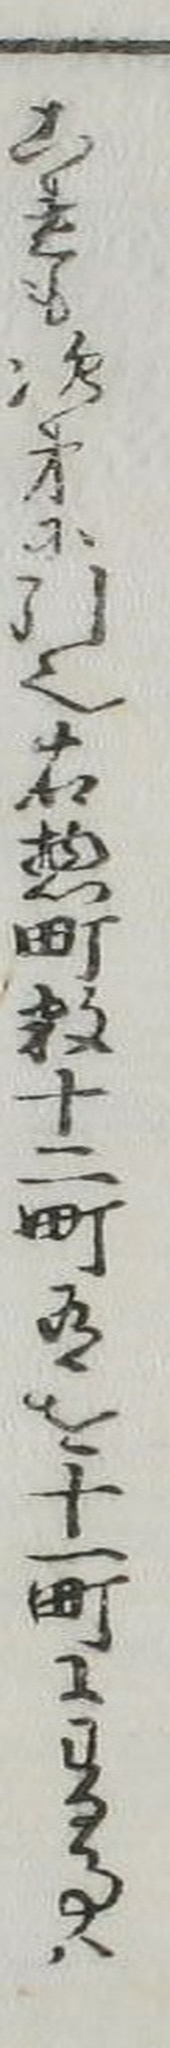これも次第に引也右惣町数十二町有を十一町にわる事は
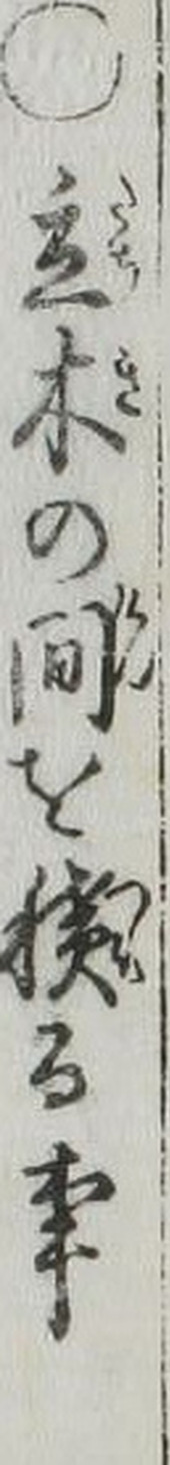○立木の間を積る事
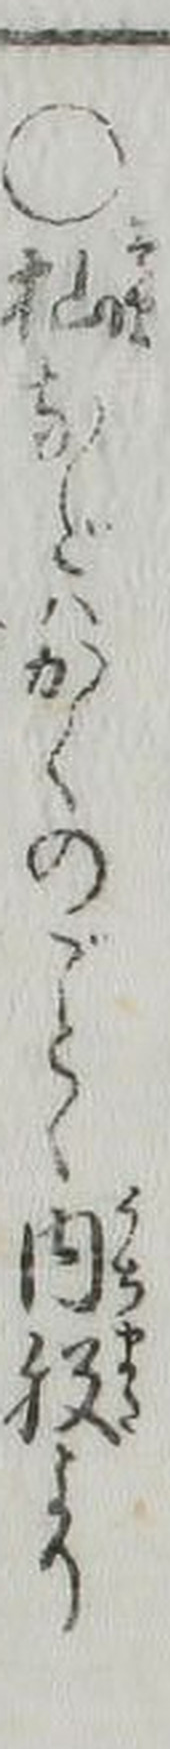○杣などはかくのごとく内股より
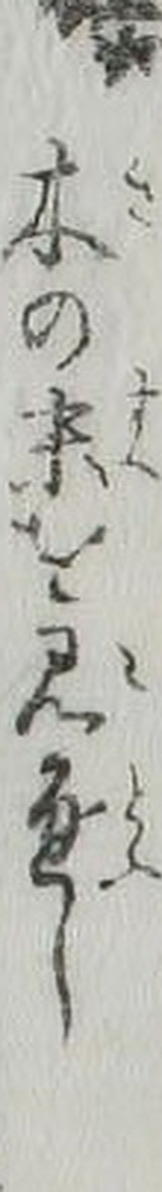木の末を見通し
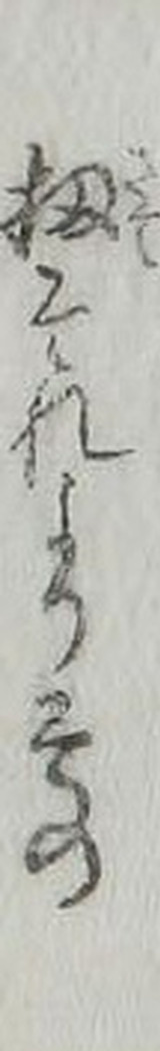扨それよりその
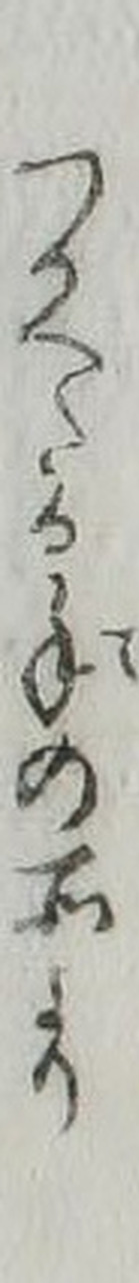つかへたる手の所より
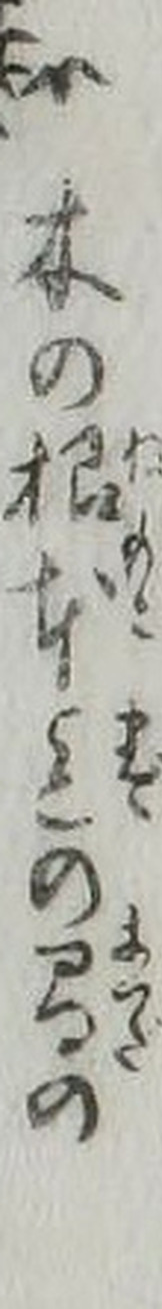木の根本迄の間の
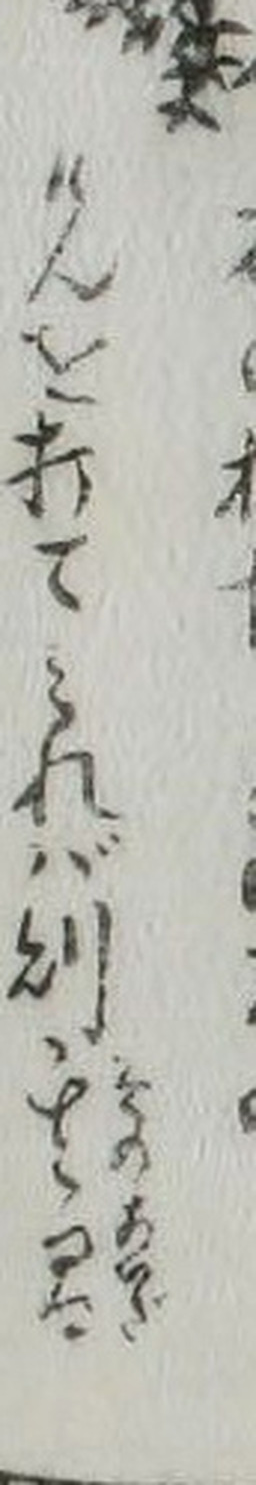けんを打てみれば則其間
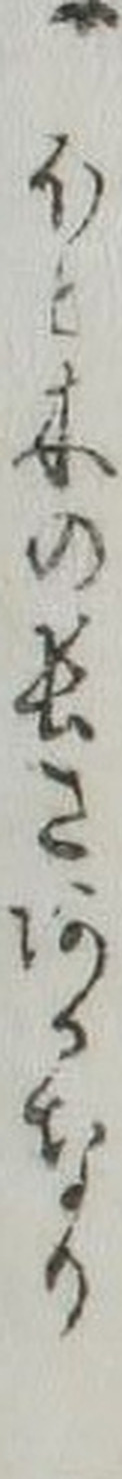ほと木の長さあるなり

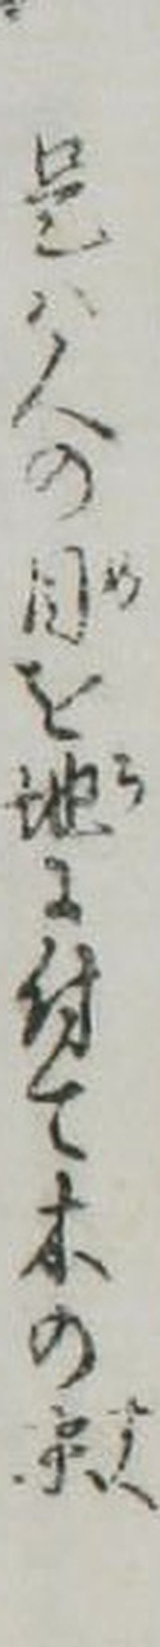是は人の目を地に付て木の末
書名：宝玉塵劫記
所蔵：東京学芸大学教育コンテンツアーカイブ
